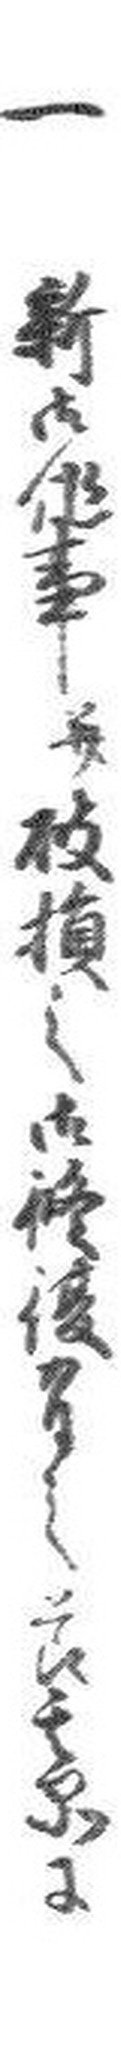一新御作事并破損之御修復有之節其品に
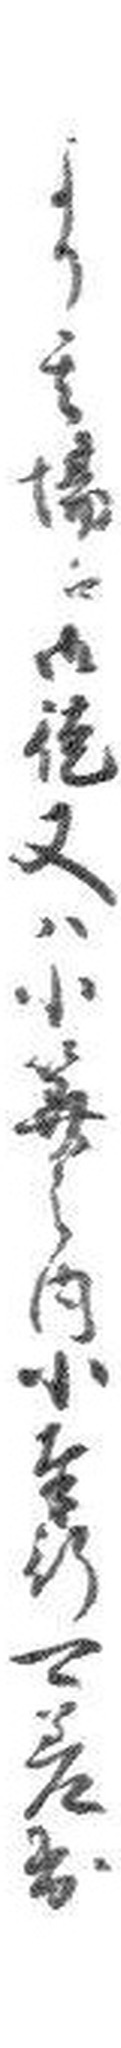より其場江御証文ハ小算之内小奉行可差出
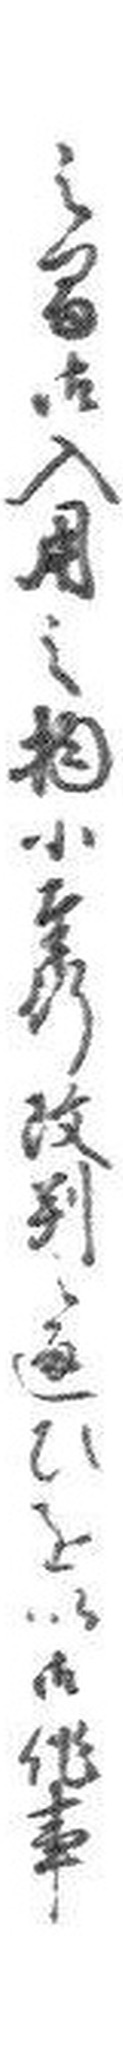之間御入用之物小奉行改判之通ひを以御作事
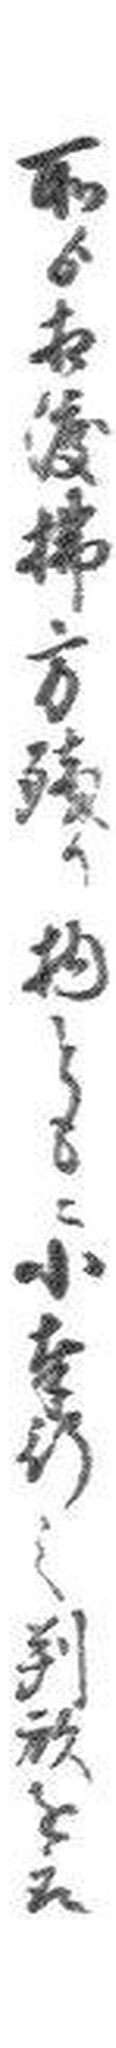所ゟ相渡払方残り物ともニ小奉行之判行を取
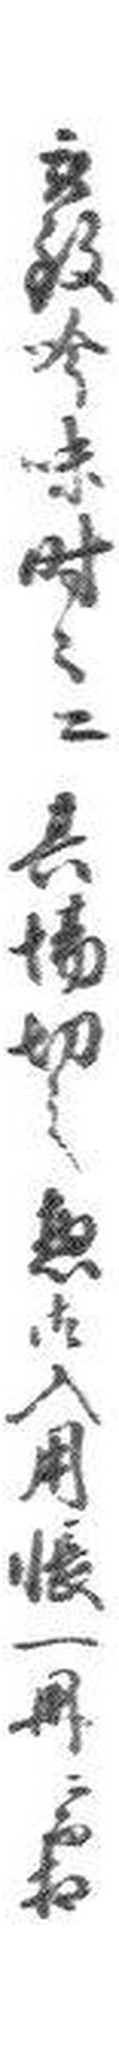被致吟味時々ニ其場切之惣御入用帳一冊ニ而相

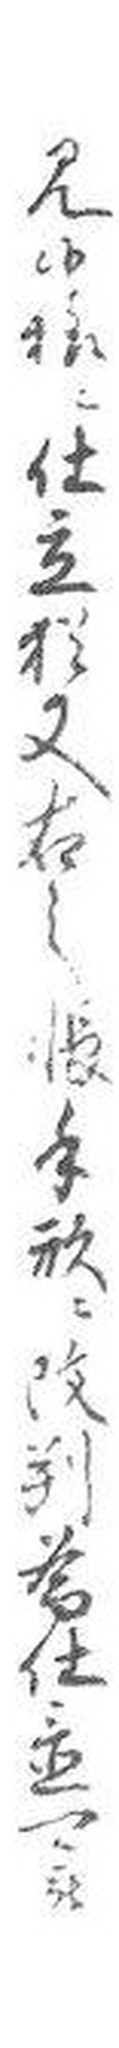見候様仕立将又右之帳手形ニ改判為仕置可被
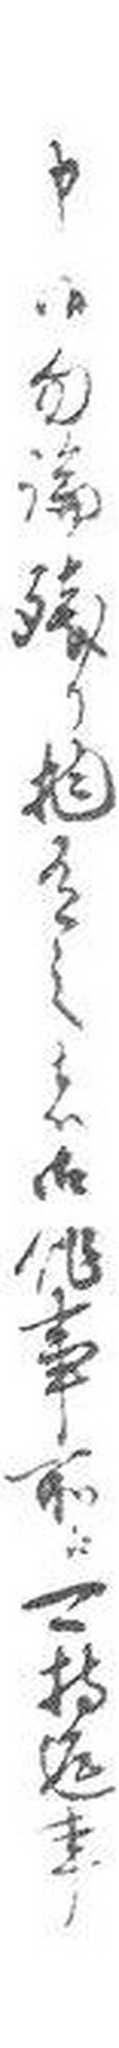申候勿論残之物有之者御作事所江可持返事
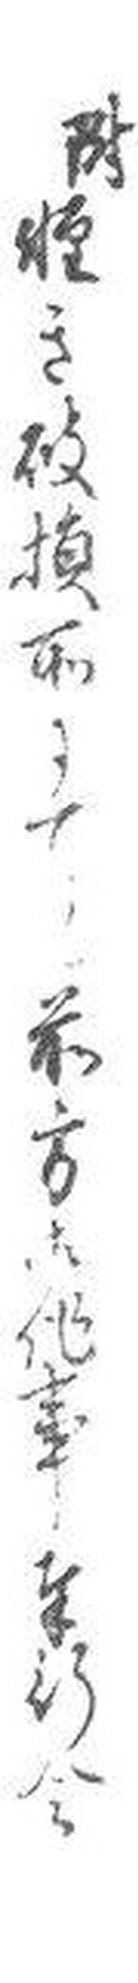軽き破損所にて者前方御作事奉行令
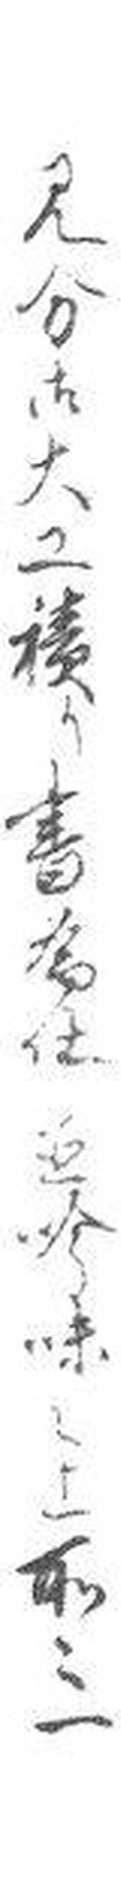見分御大工積り書為仕置吟味之上所々一
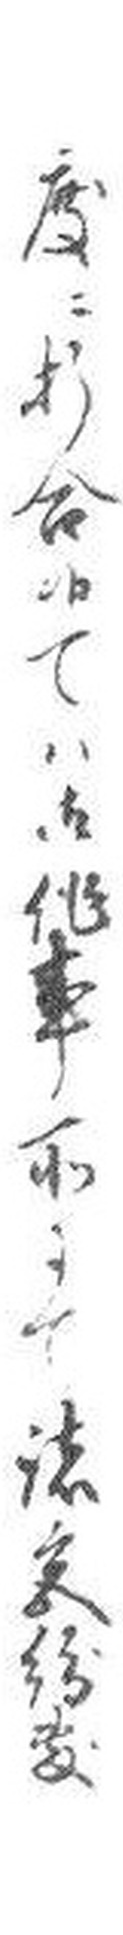ニ度ニ打合候てハ御作事所にて諸色紛敷
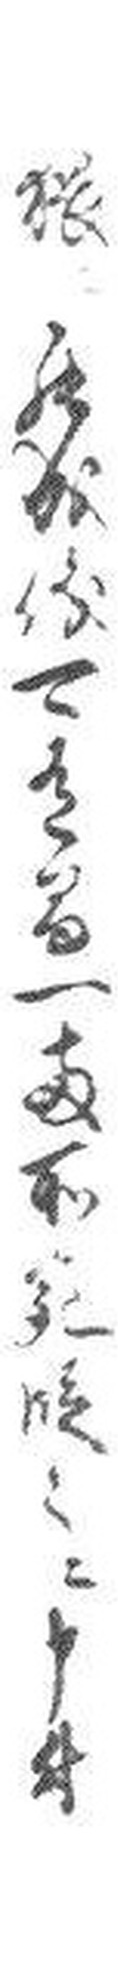猥ニ罷成儀可有間一両所宛段々ニ申付
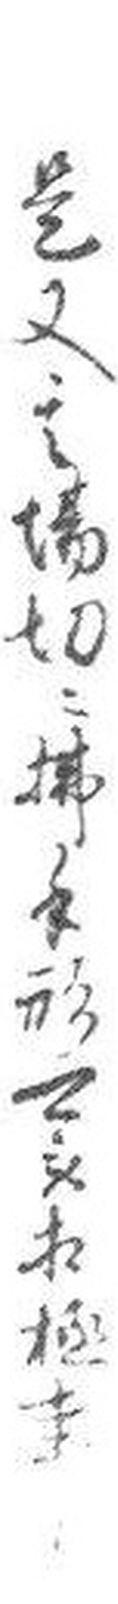是又其場切ニ払手形可被相極事
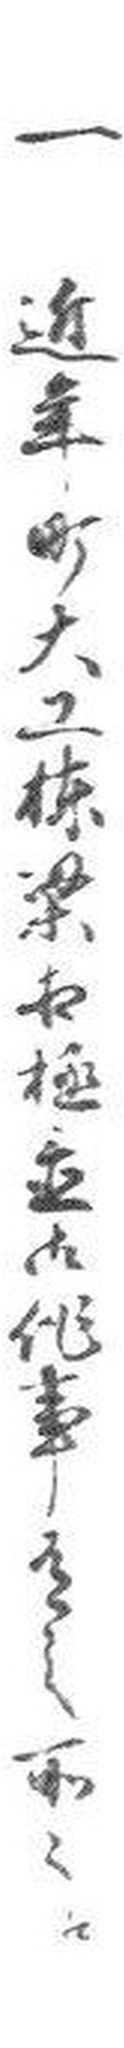一近年町大工棟梁相極置御作事有之所々江
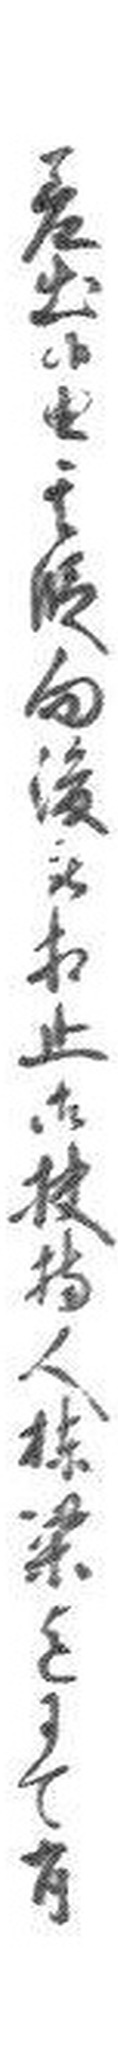差出候由其段向後被相止御扶持人棟梁迄にて有
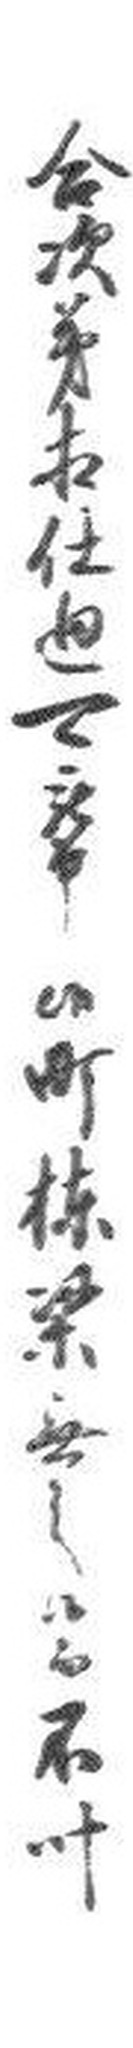合次第相仕廻可被申候町棟梁無之候而不叶
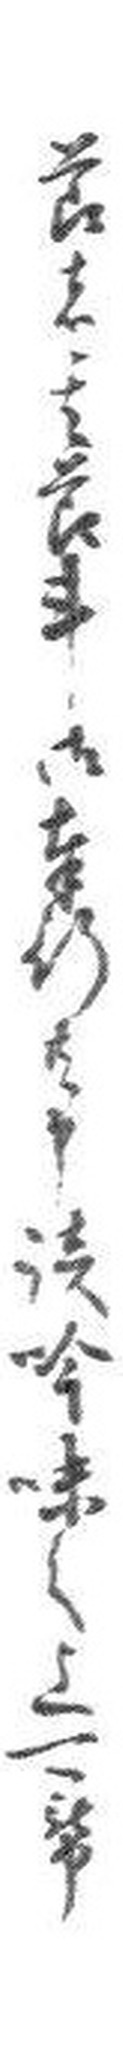節者其節計御奉行共申談吟味之上可被申
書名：家譜 二十九 吉邦公 従正徳二年到正徳三年
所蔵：福井県文書館 Fukui Prefectural Archives
